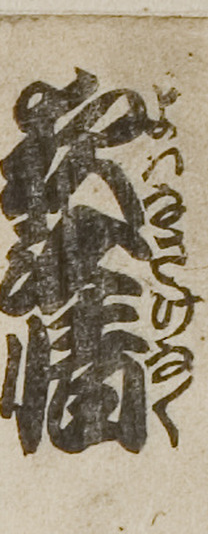夜無情
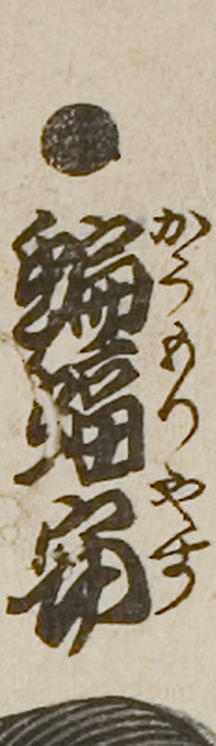●蝙蝠安
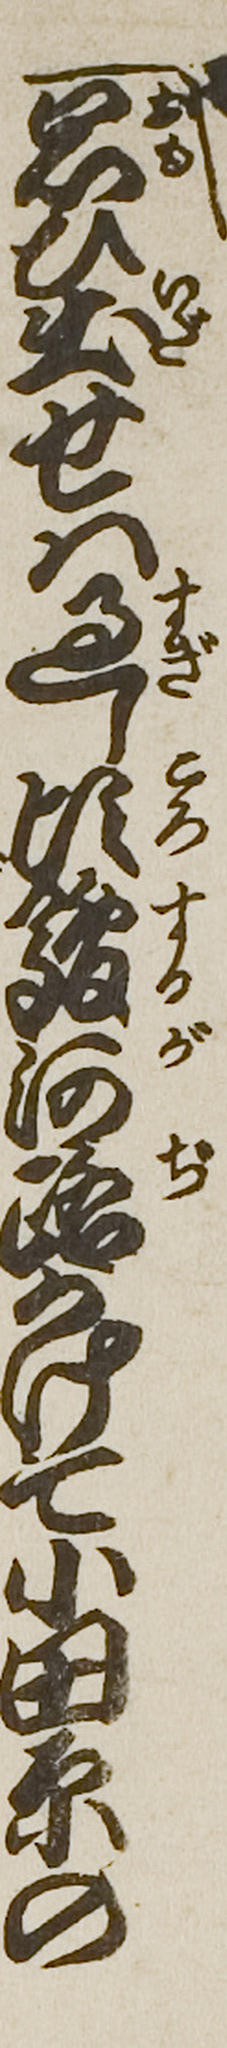〽思ひ出せは過し頃駿河路かけて小田原の
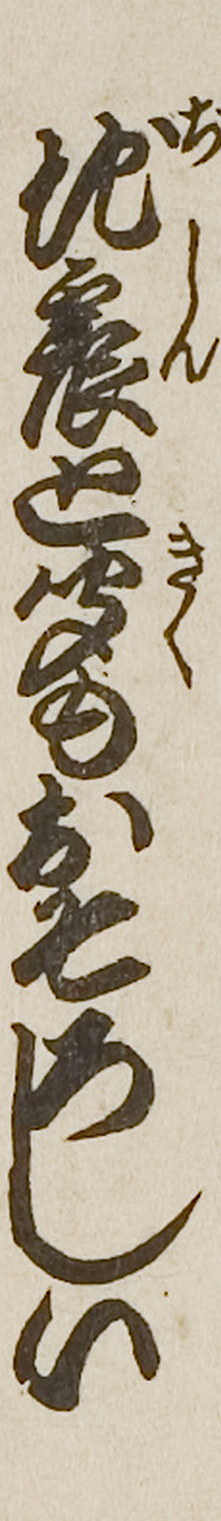地震と聞もおそろしい
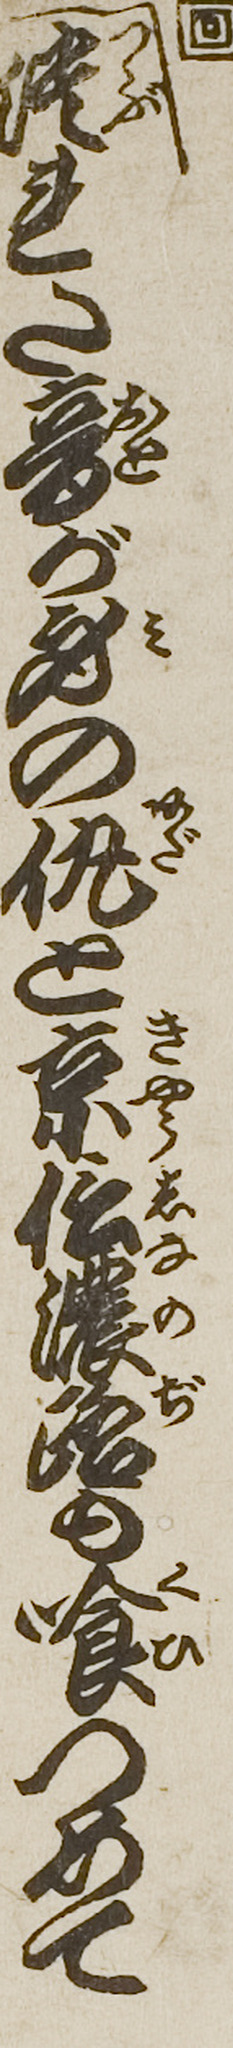〽潰れて音が身の仇と京信濃路も喰つめて
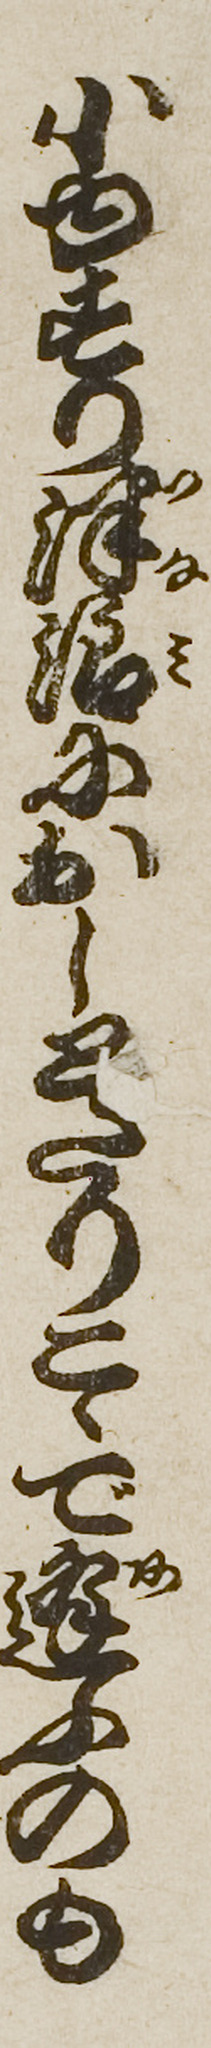小ゆすり津浪におしたりこゝで逢ふのも
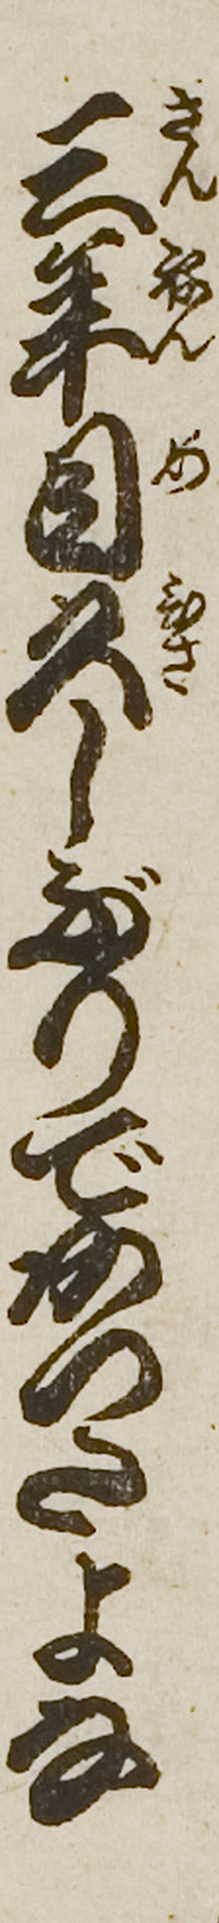三年目久しぶりであつたよな
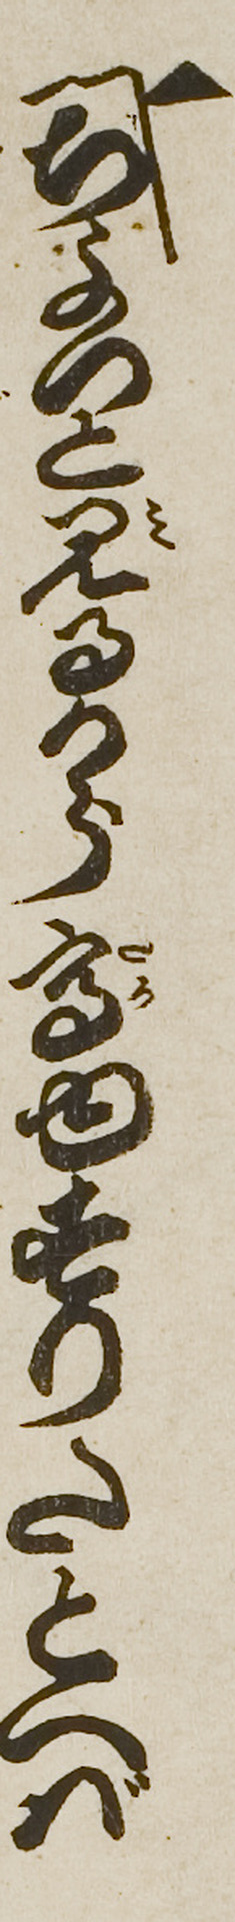〽ちよつと見るから高ゆすりたとへば
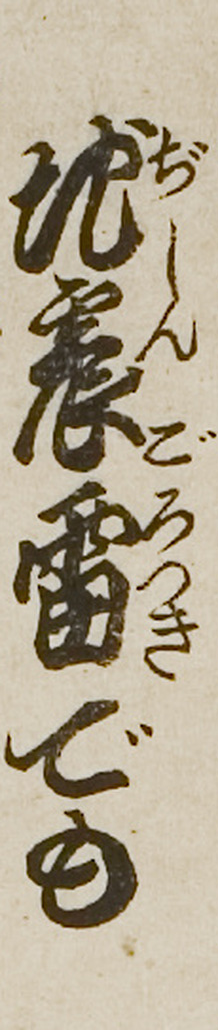地震雷でも
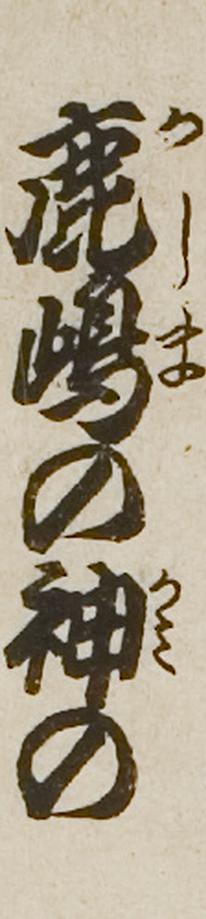鹿嶋の神の
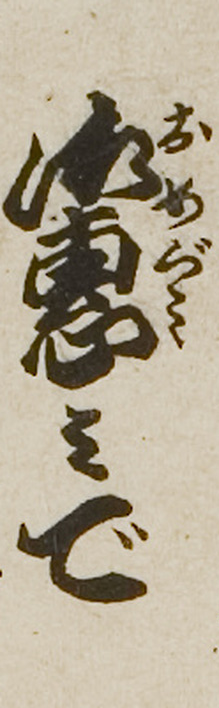御恵みで
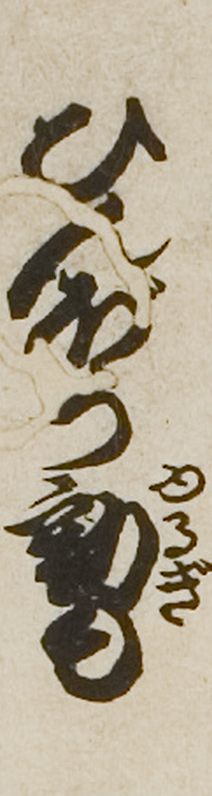ひんぼう動も
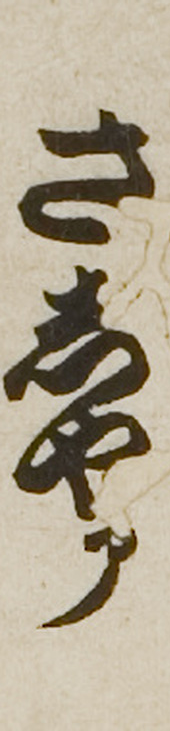さしやア
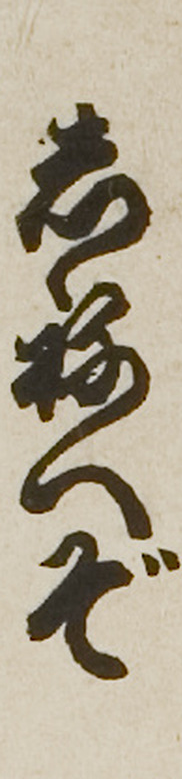しねへぞ
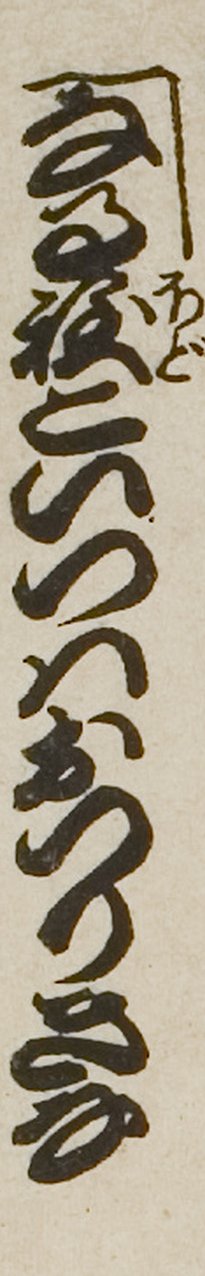〽なる程こいつはおつりきな
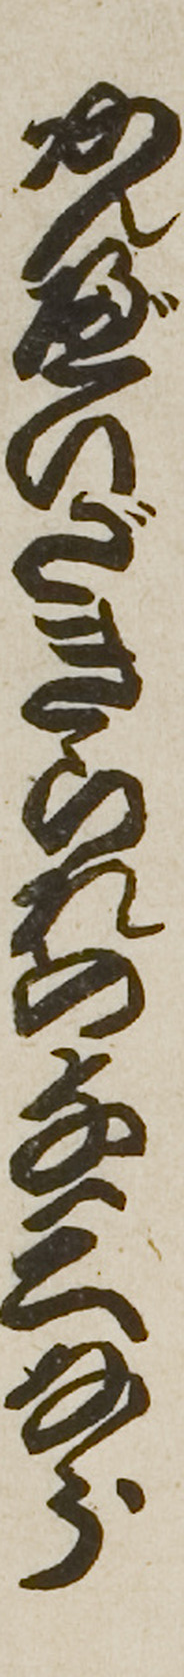あんべいだきられの与三なら
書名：夜無情浮世有様 かけ合いせりふ
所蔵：東京大学総合図書館 General Library in the University of Tokyo, JAPAN
